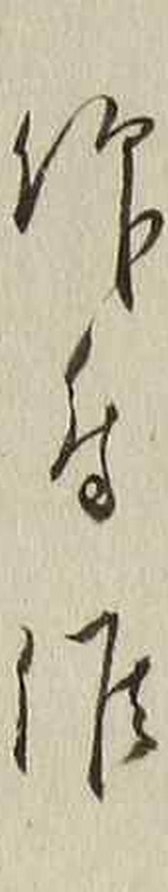仰付候
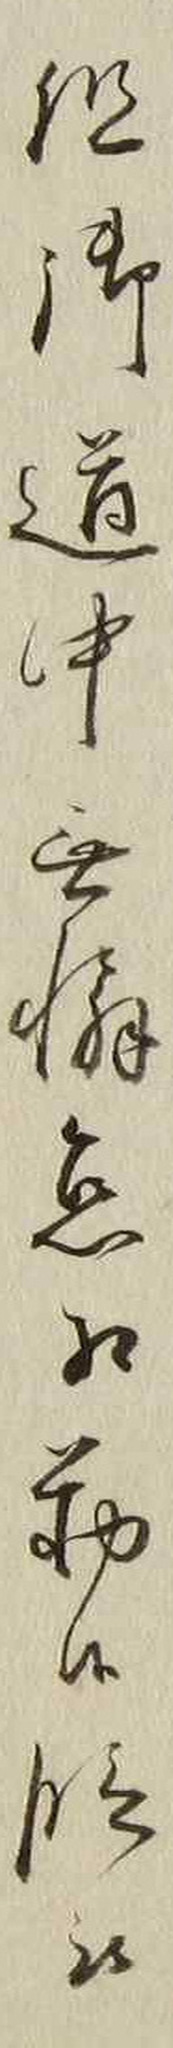但御道中無懈怠相勤候段被
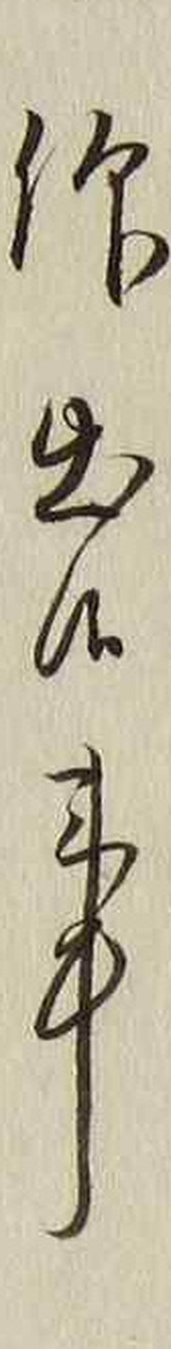仰出候事
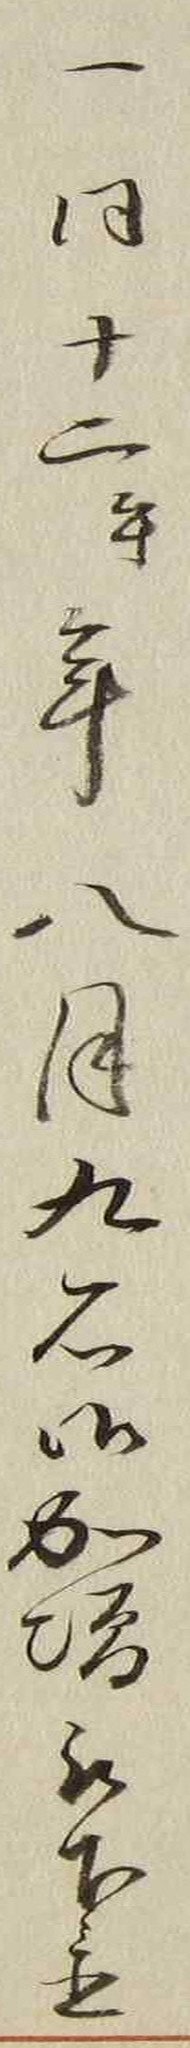一同十二午年八月九石御加増被下置
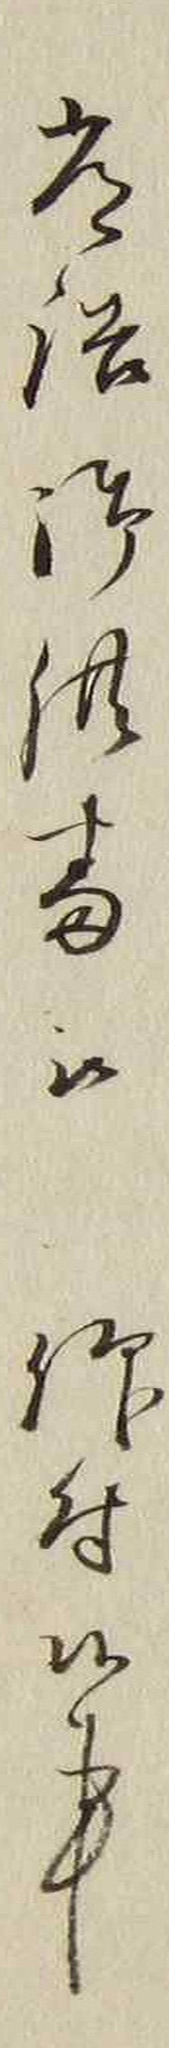常詰御供番候被仰付候事
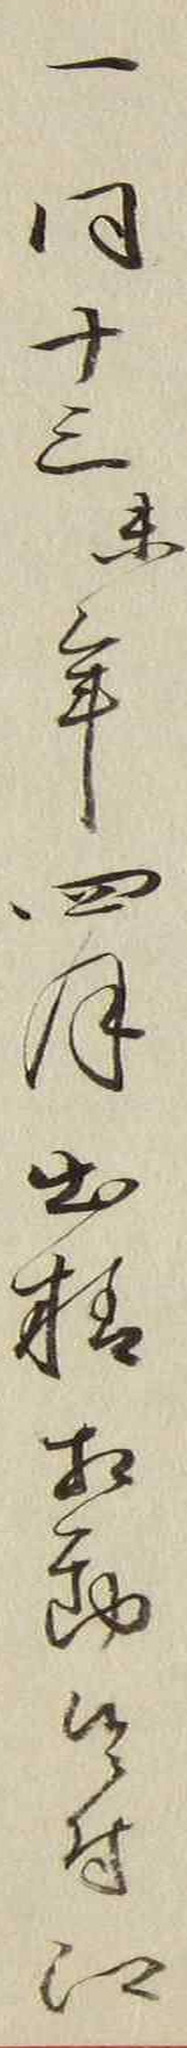一同十三未年四月出精相勤候ニ付江

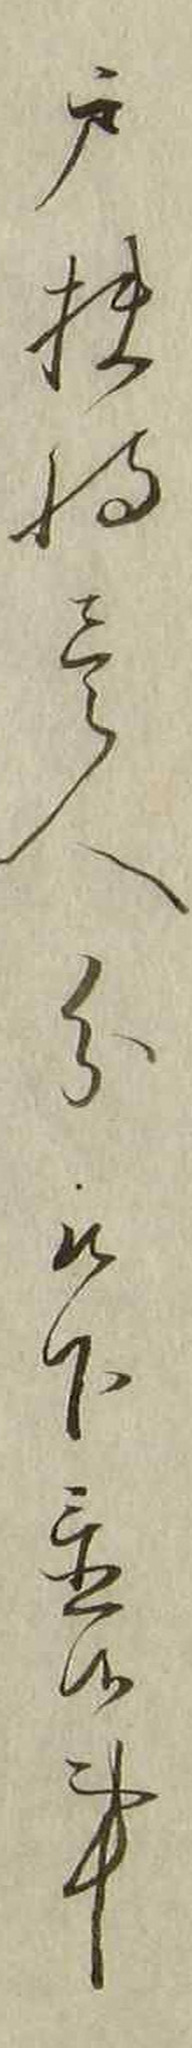戸扶持壱人分被下置候事
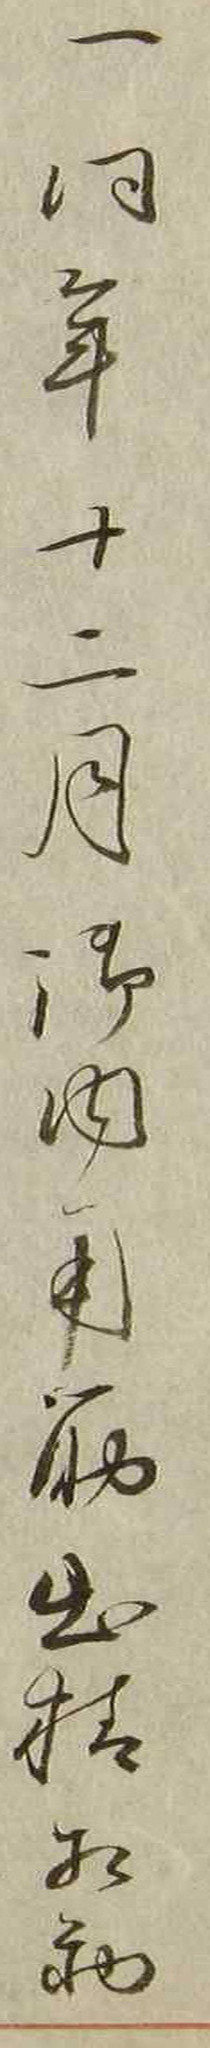一同年十二月御内用筋出精相勤
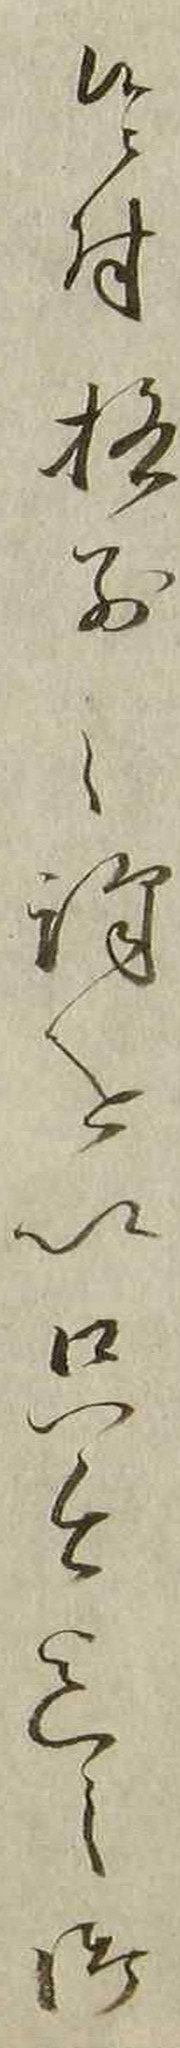候ニ付格別之訳を以只今迄之御
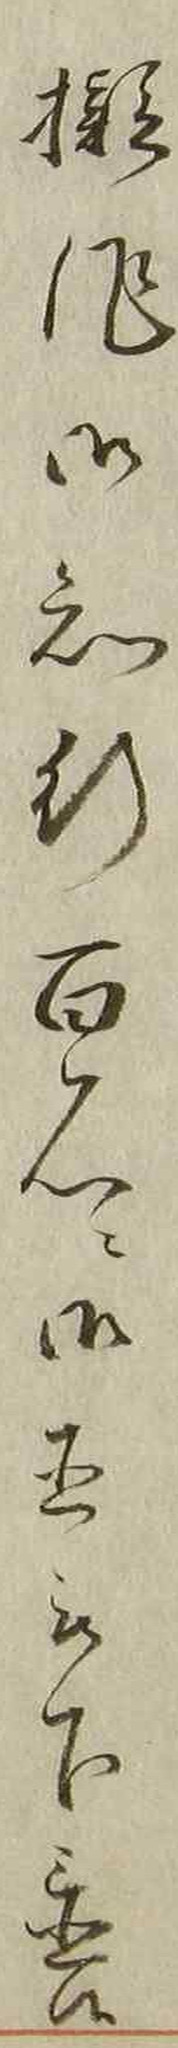擬作御知行百石ニ御直被下置候
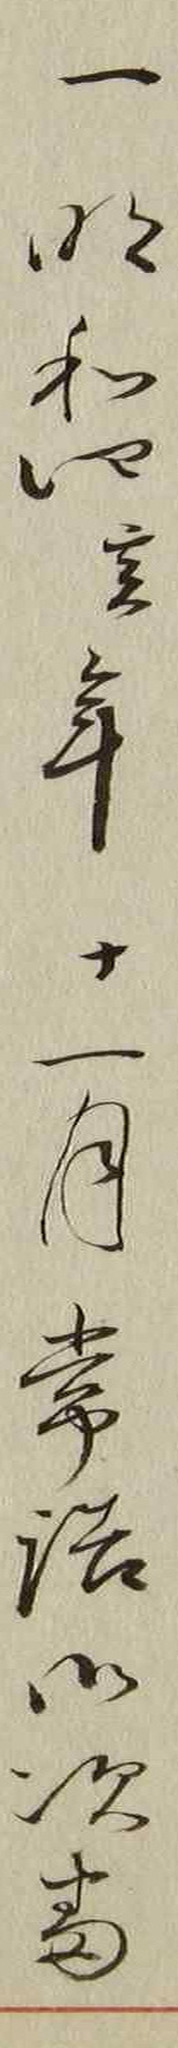一明和四亥年十一月常詰御次番
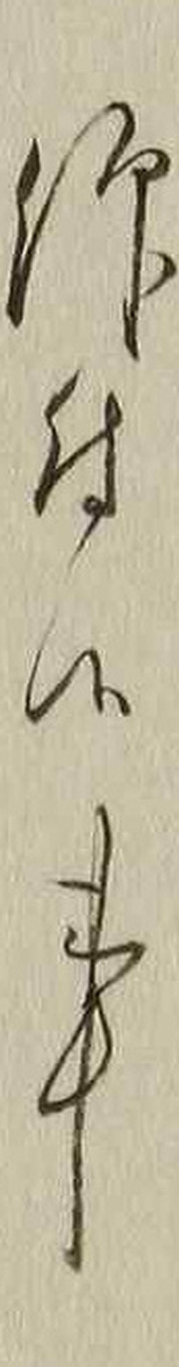仰付候事
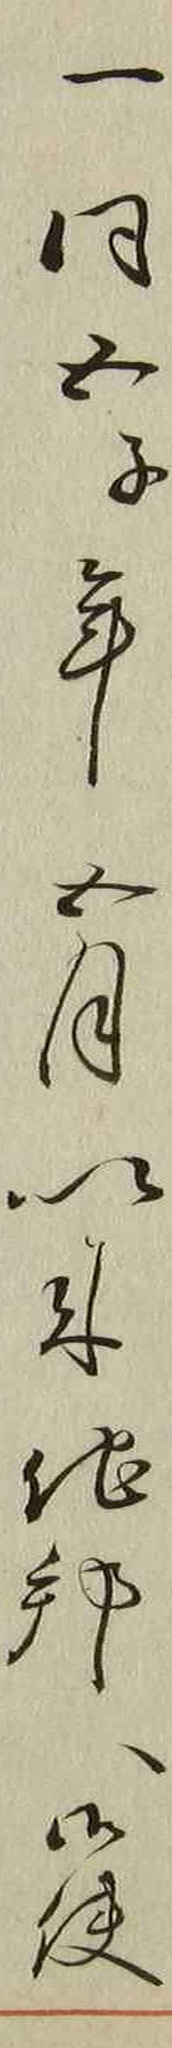一同五子年五月以来他邦へ御使
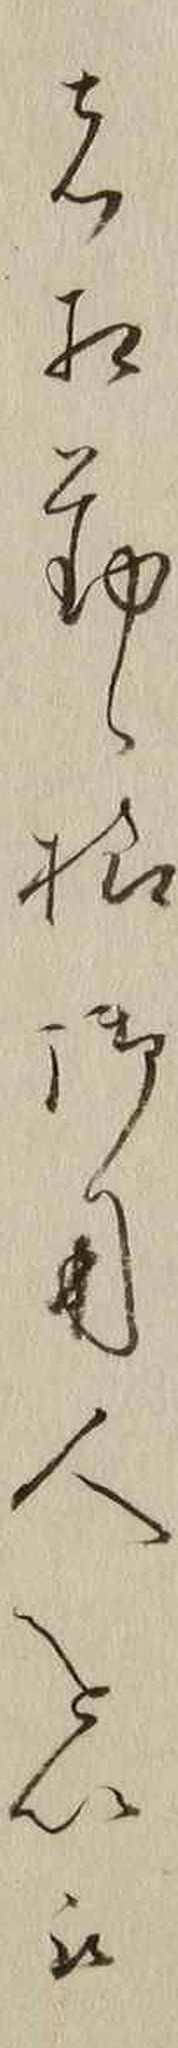者相勤候様御用人を以被
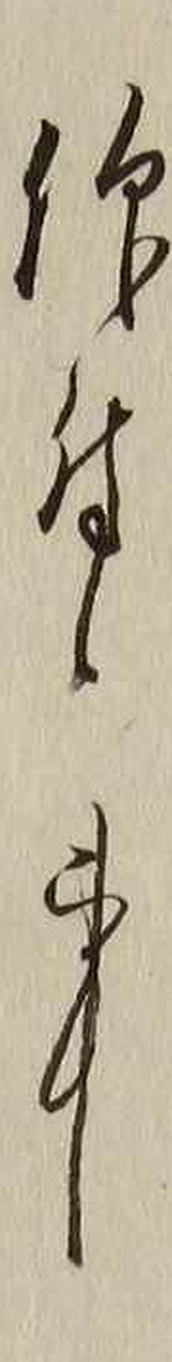仰付候事
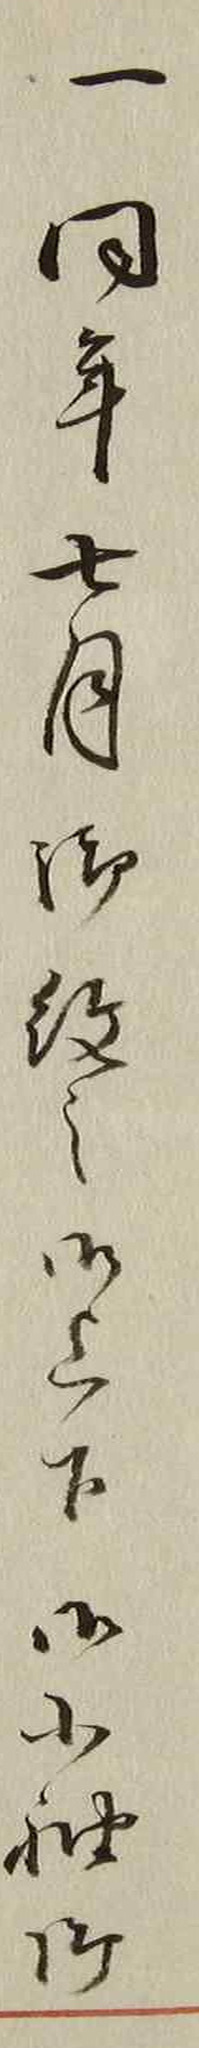一同年七月御紋之御上下御小袖御
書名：諸士系譜　巻之28　い之部28
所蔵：会津若松市立会津図書館
